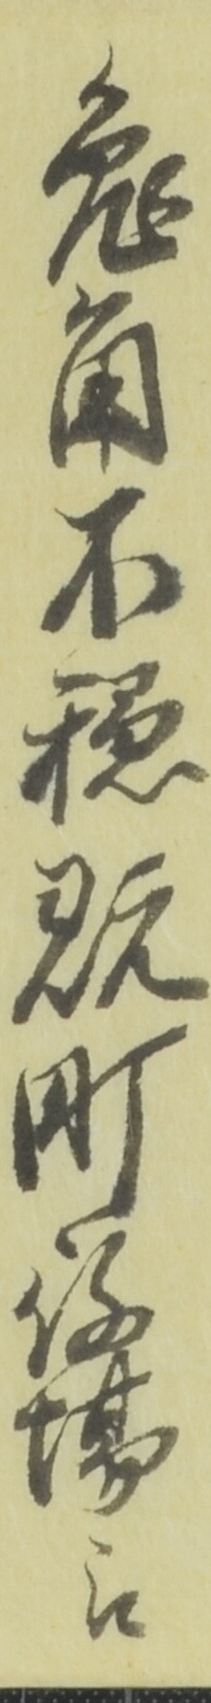兎角不隠翫町役場江
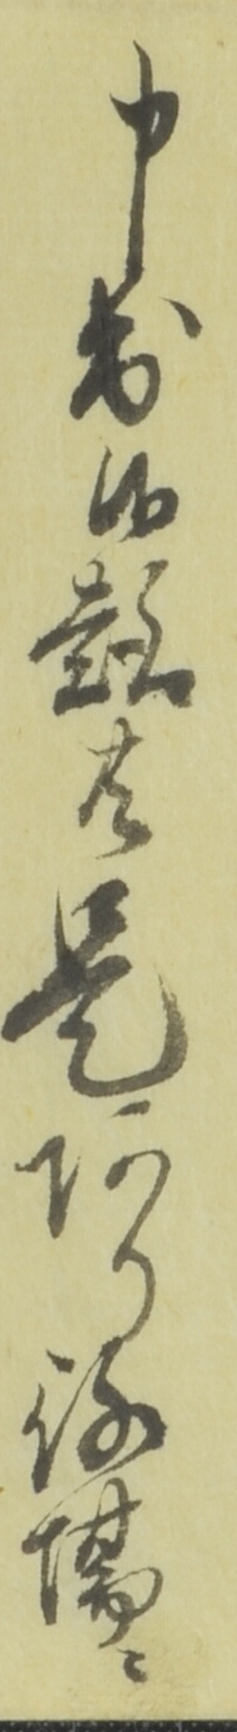申出候趣共是あり役場ニ
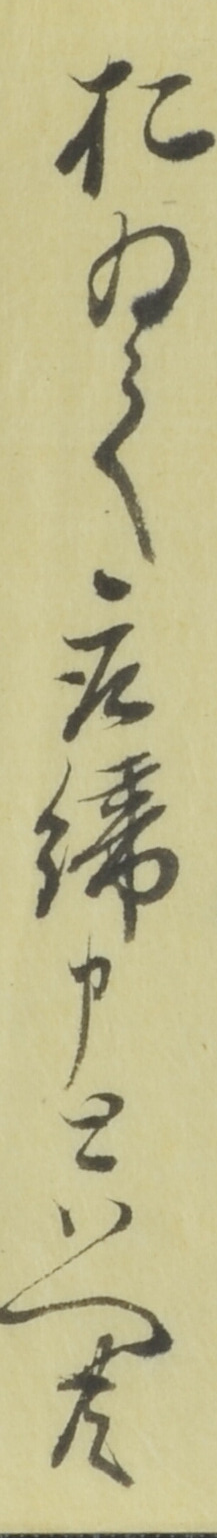於ゐて取締申といへ共
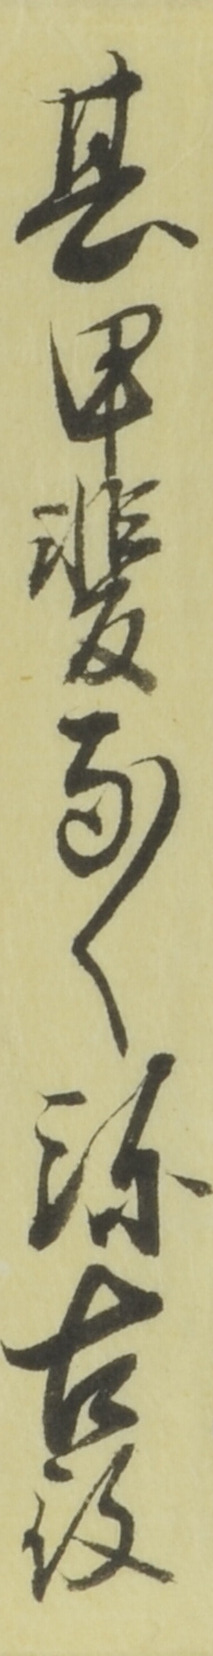甚甲斐なく弥古役
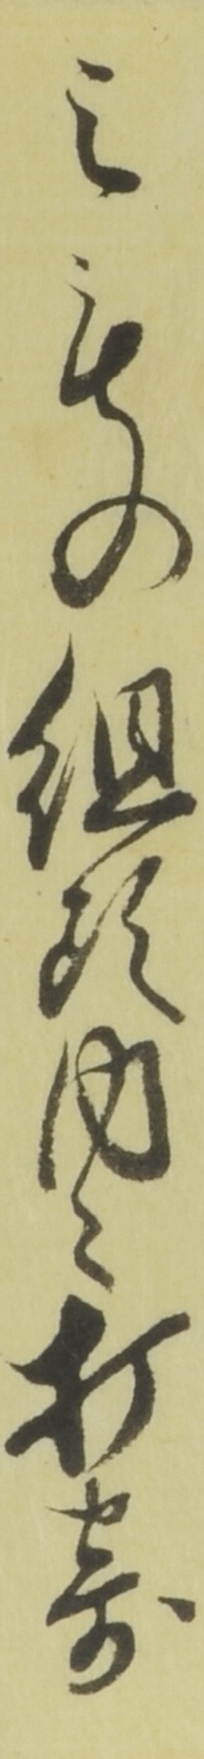之もの組頭内々打寄
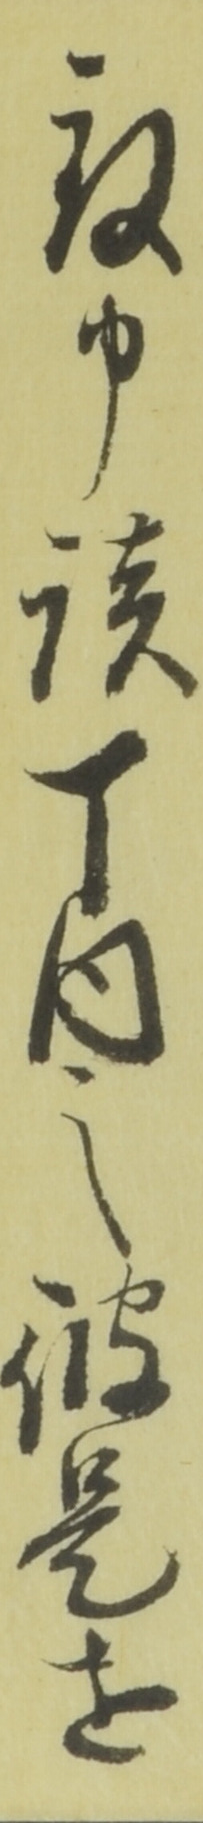致申談丁内之彼是を
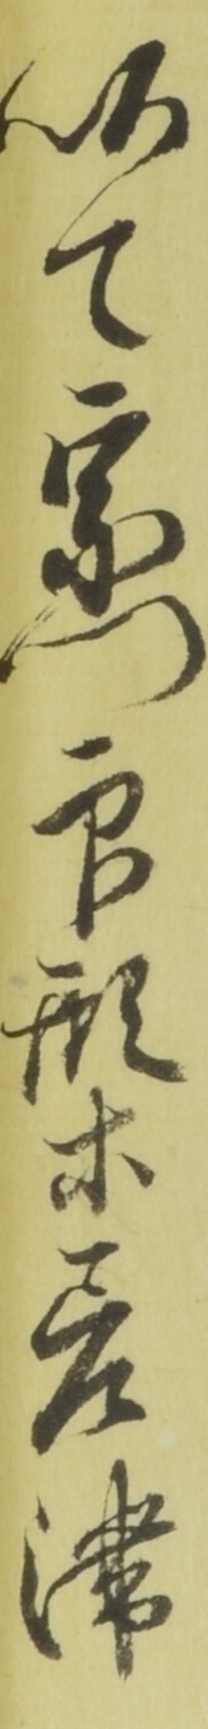以て宗門印形等差滞
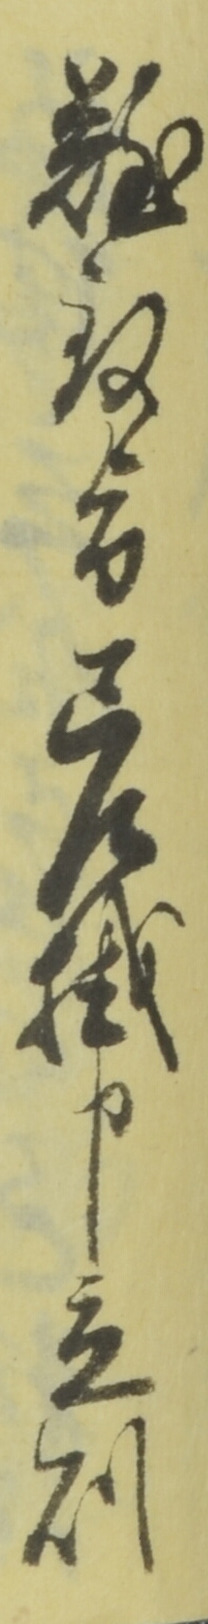難致旨差掛申立則
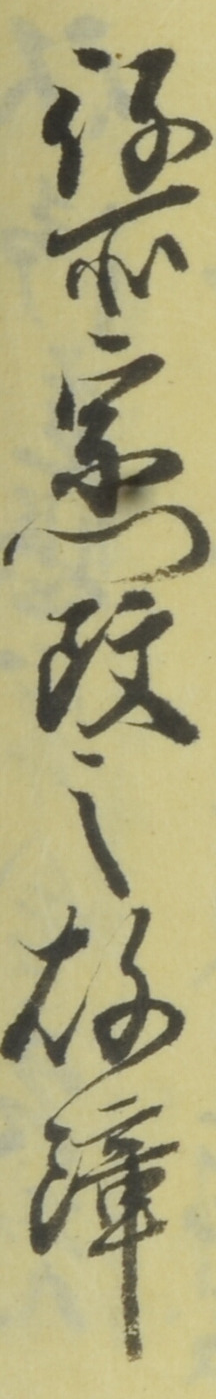役所宗門改之故障

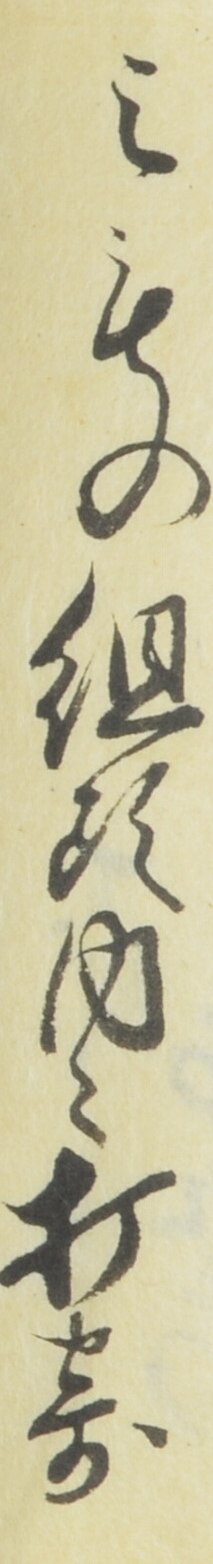之もの組頭内々打寄
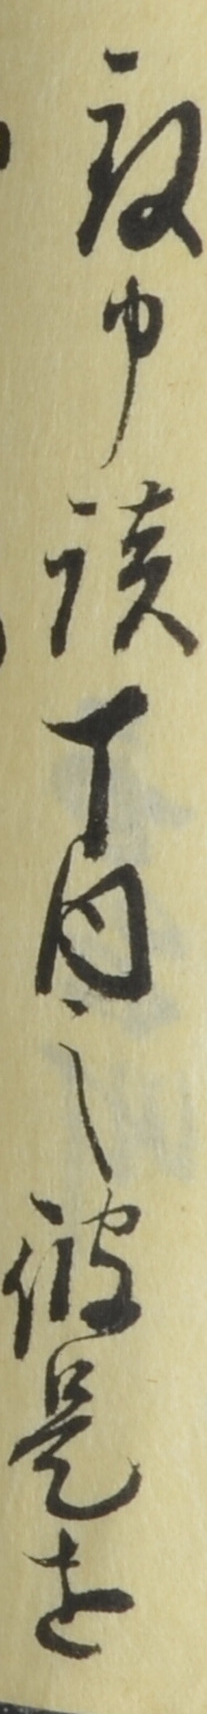致申談丁内之彼是を
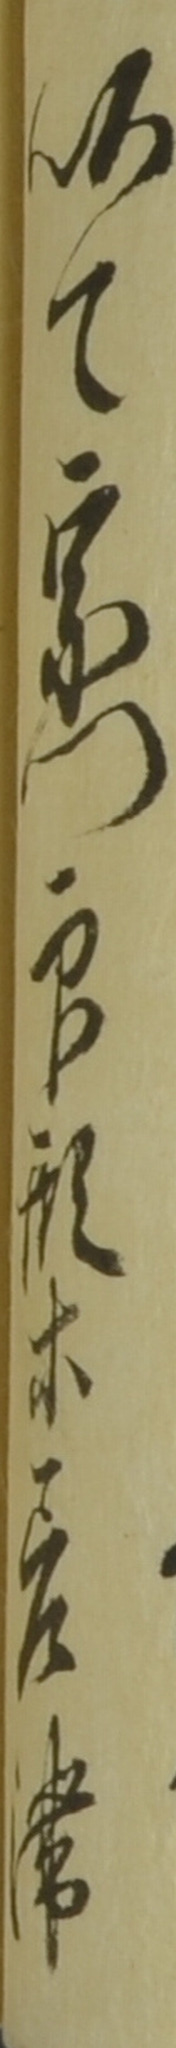以て宗門印形等差滞
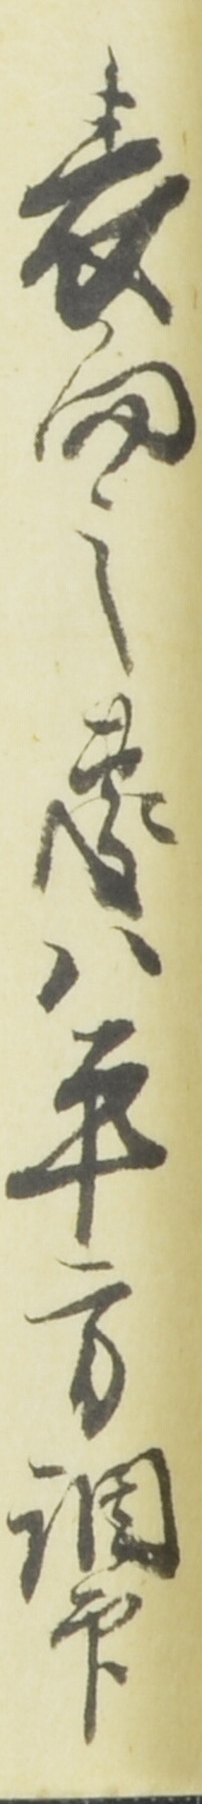表向之処ハ平方調印
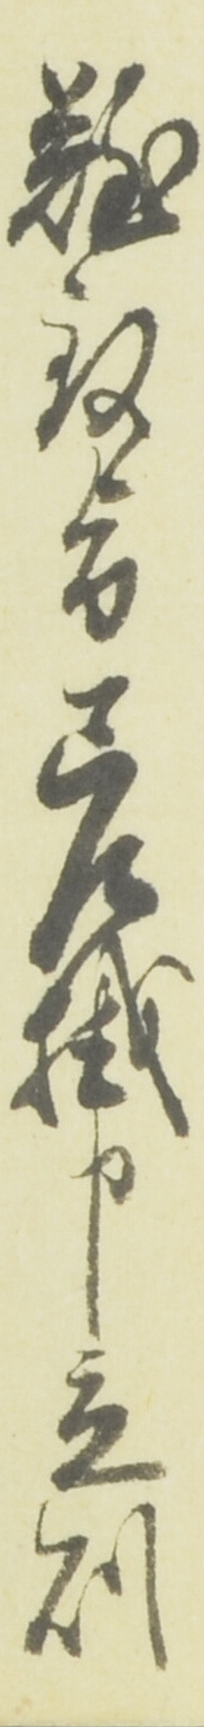難致旨差掛申立則
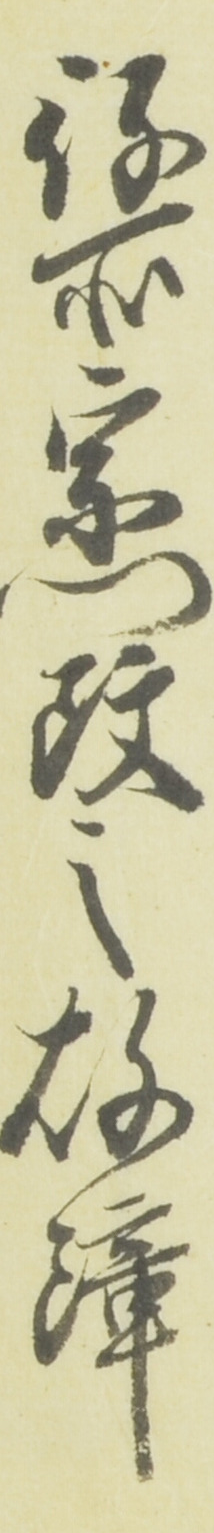役所宗門改之故障
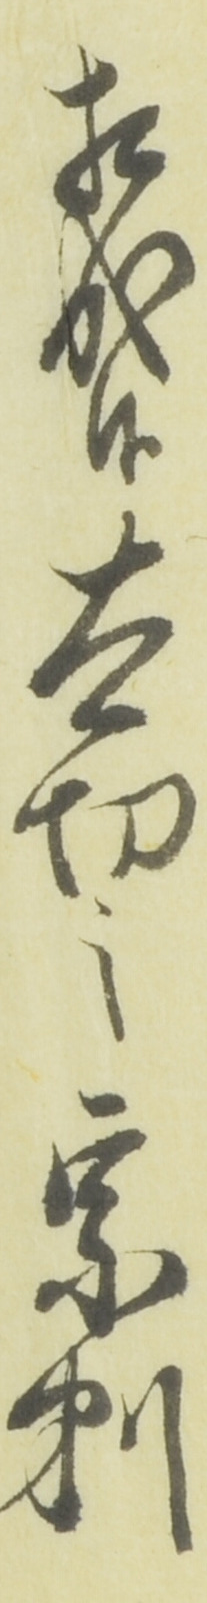相成候太切之宗刺
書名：御触書御書附控
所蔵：伊那市立高遠町図書館・合同会社AMANE
